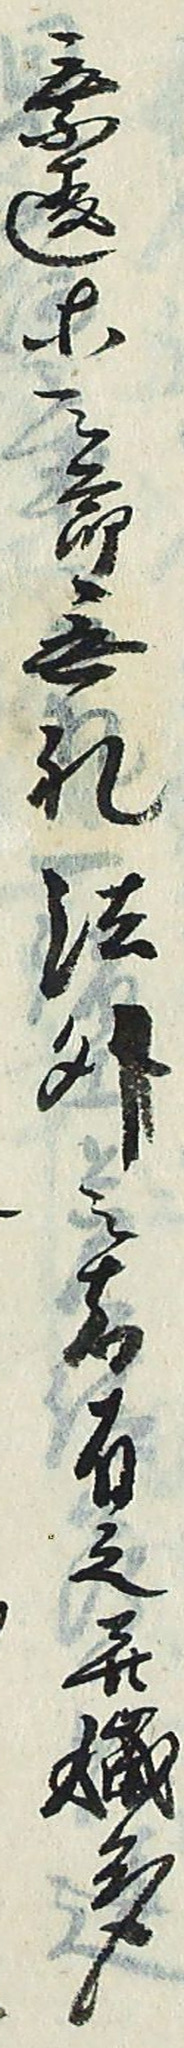乗違等之節無礼法外之者有之幷穢多
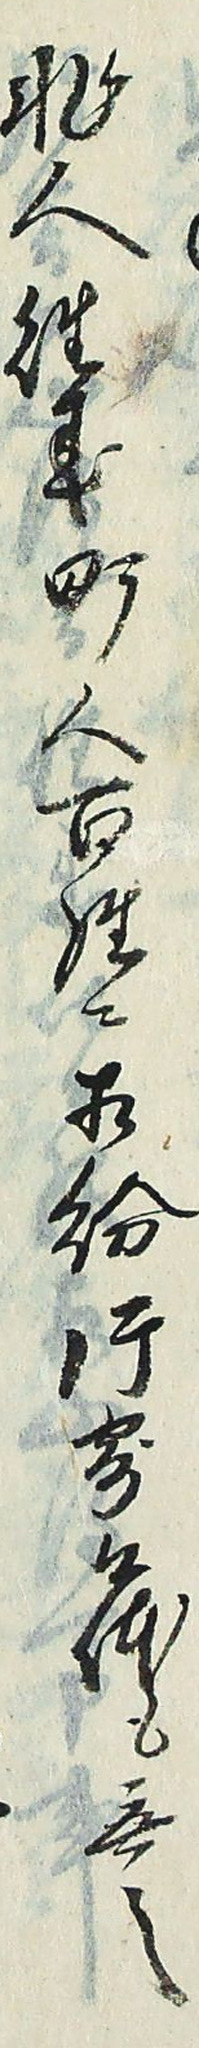非人往来町人百姓に相紛片寄候体も無之
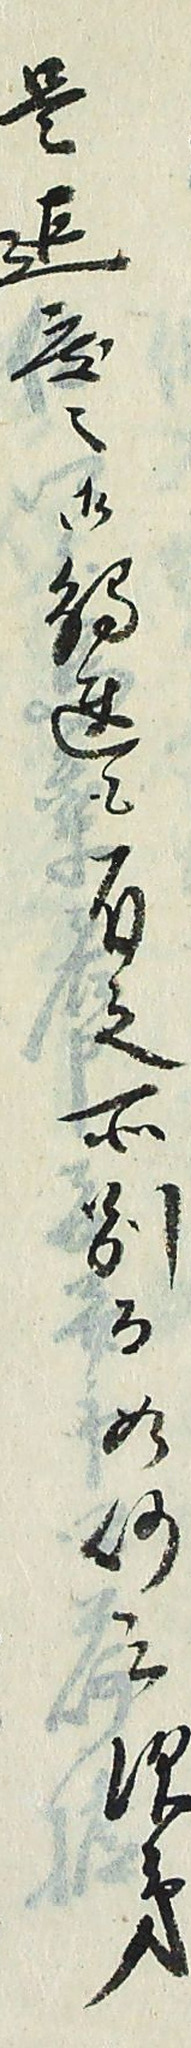是迄度々御触達も有之所別て如何之次第
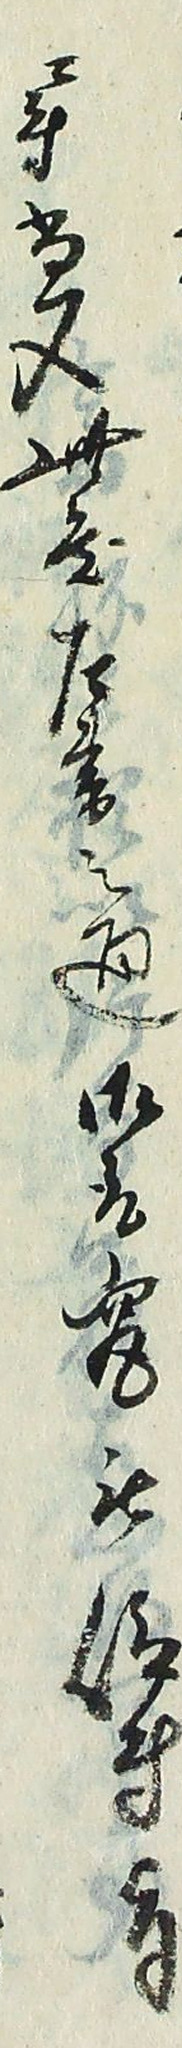に付尚又此度左書之通御取究被仰付旨
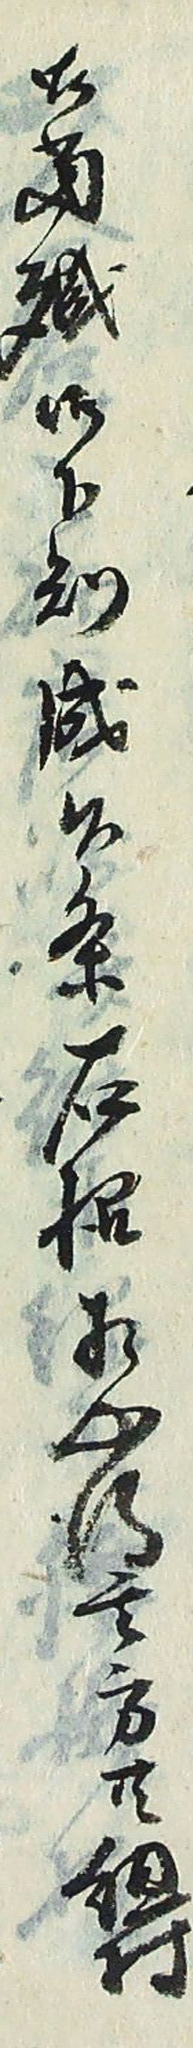御当職御下知成候条右様相心得其方共組村
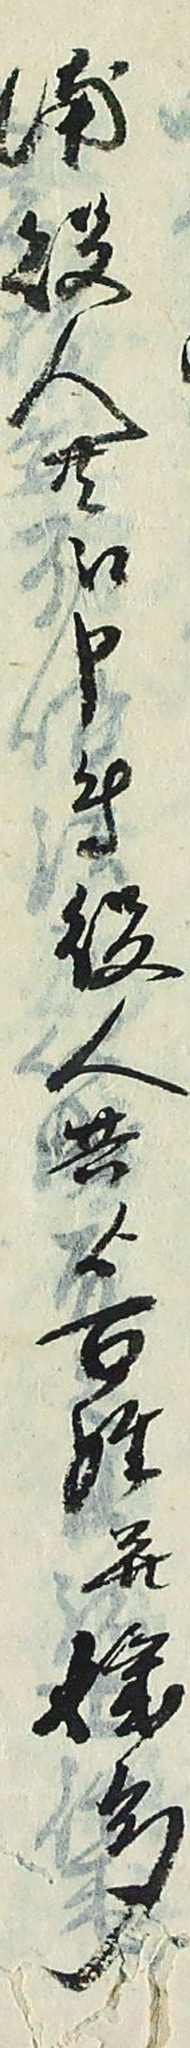浦役人共江申付役人共ゟ百姓幷穢多
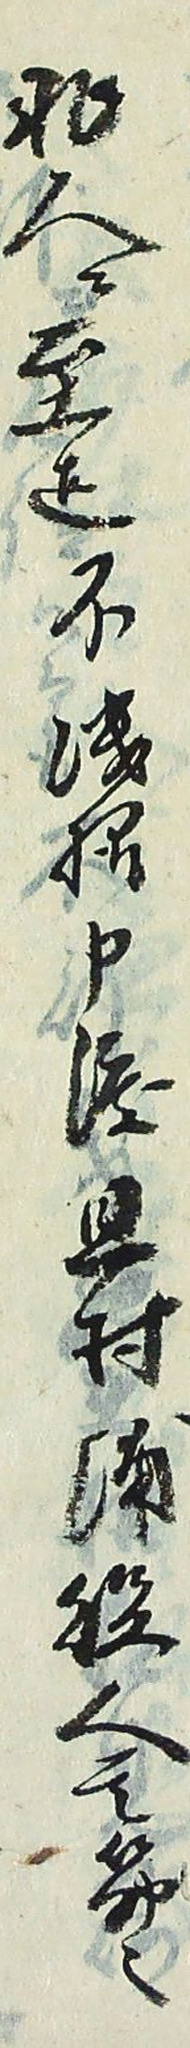非人に至迄不漏様申渡且村浦役人其筋々
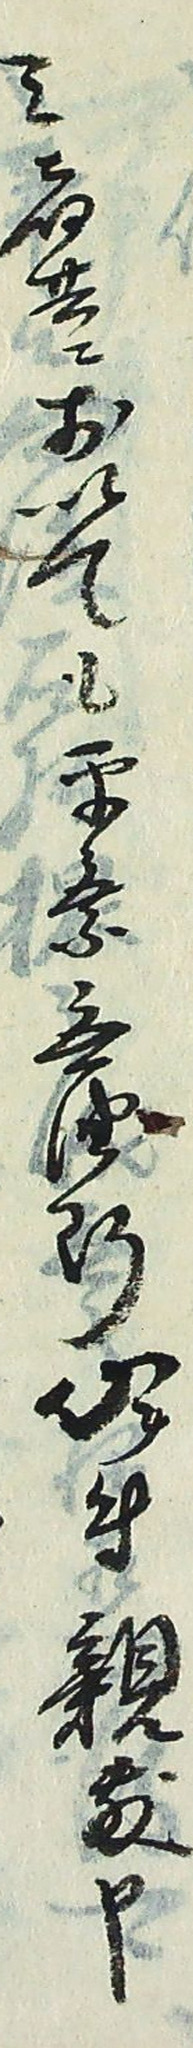之者共においても平素無油断心を付親敷申
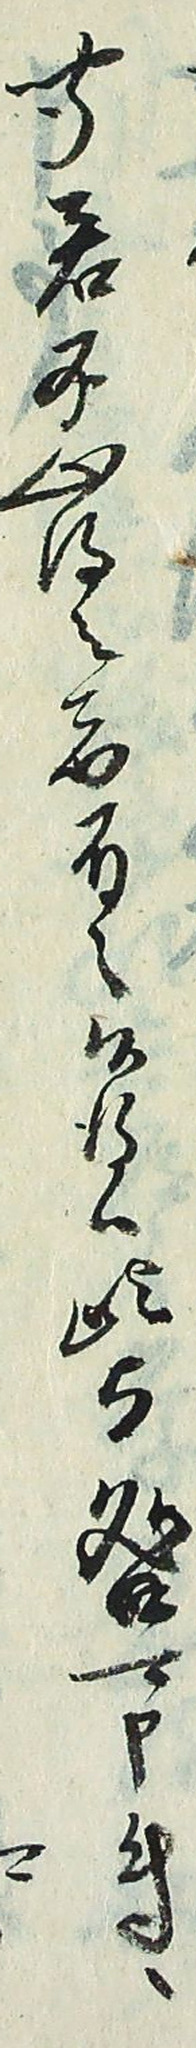聞若不心得之者有之候得は屹と咎申付候
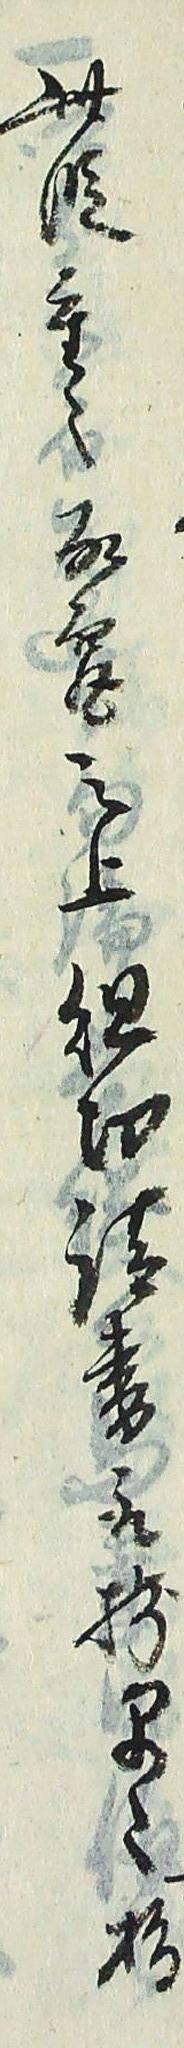此段重々取究之上組切請書取揃早々可指
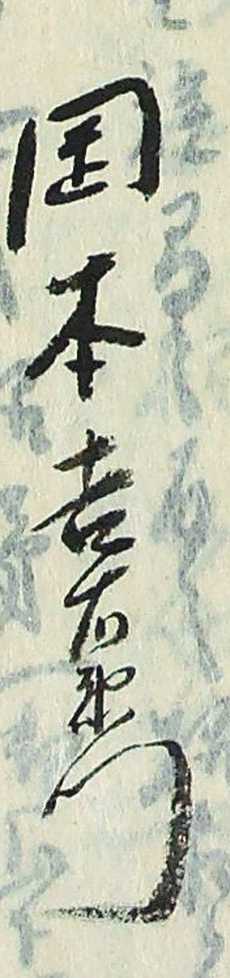岡本吉右衛門
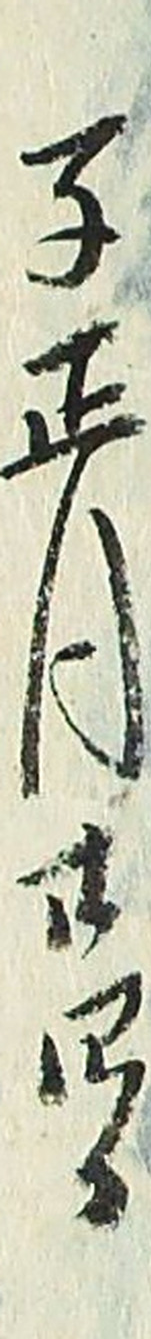子正月廿四日
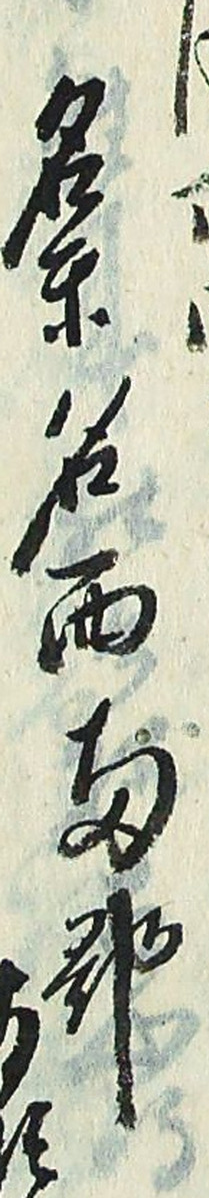名東名西両郡
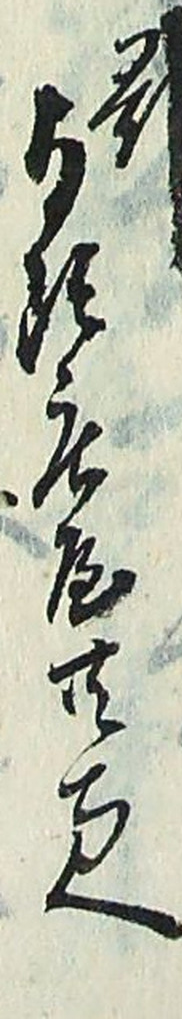与頭庄屋共方へ
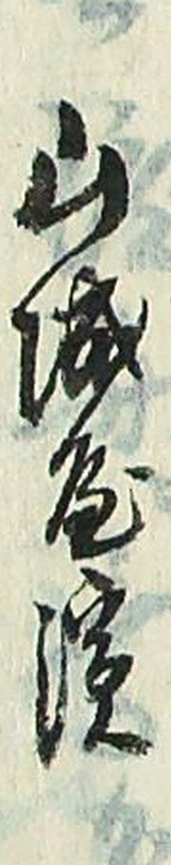山城屋濱
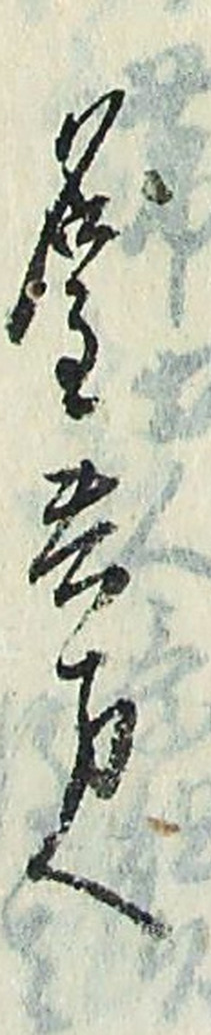名主共方へ
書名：諸御用御□受書控
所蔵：鳴門教育大学 Naruto University of Education
